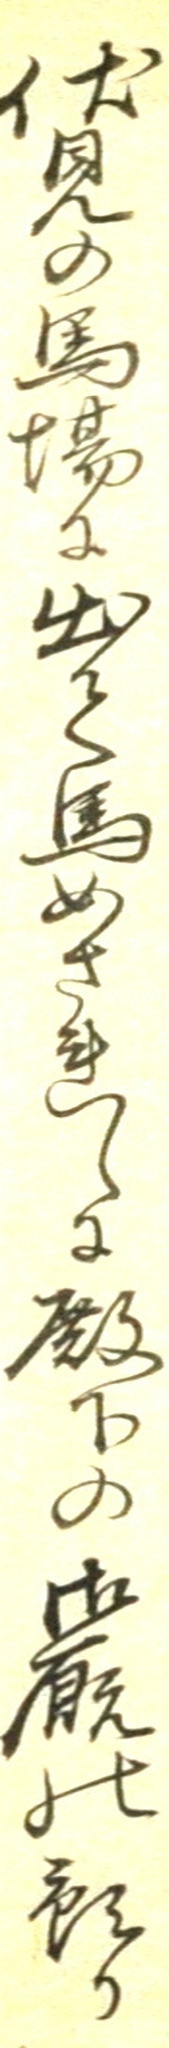伏見の馬場に出て馬めされしに殿下の御厩の預り
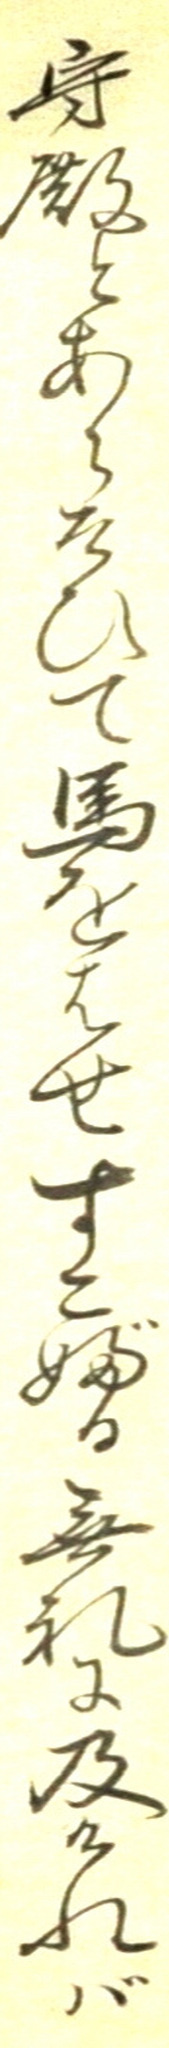守殿とあらそひて馬をはせすこふる無礼に及ければ
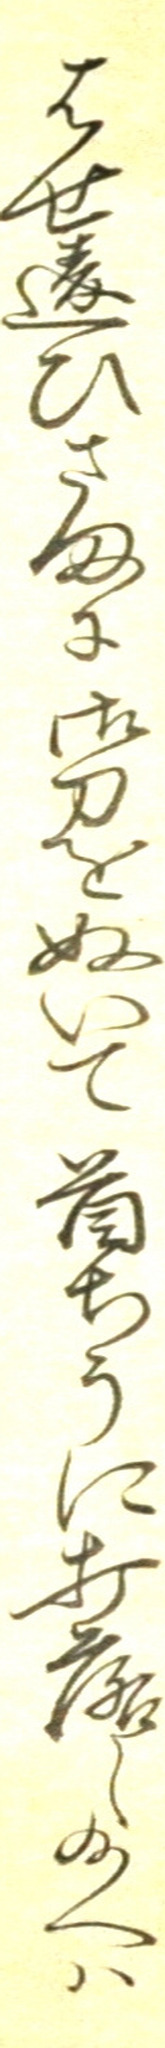はせ違ひさまに御刀をぬいて首ちうに打落し給へは
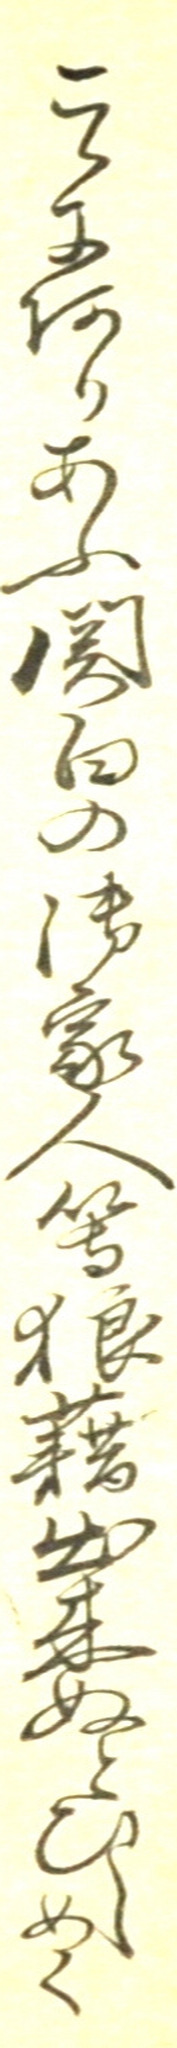こゝにありあふ関白の御家人等狼藉出来ぬとひしめく
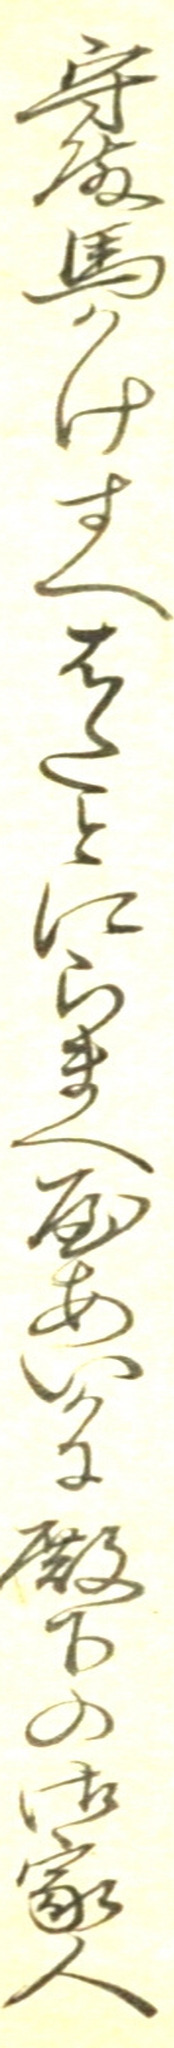守殿馬かけすへはたとにらまへやあいかに殿下の御家人
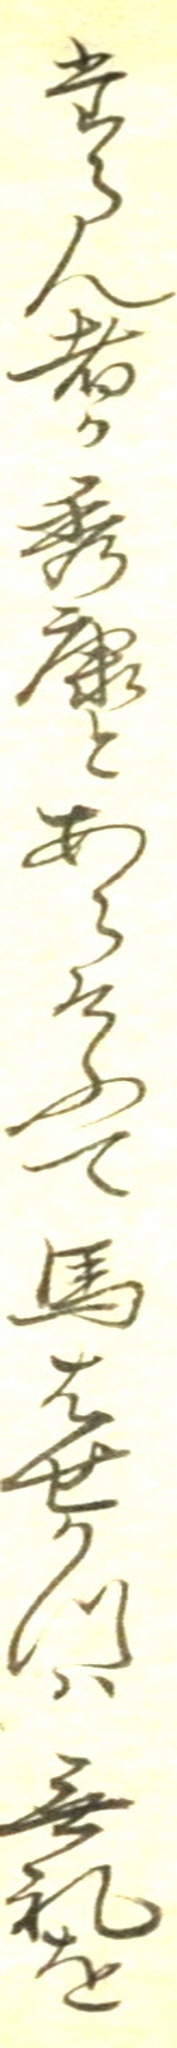たらん者か秀康とあらそふて馬はせかつは無礼を
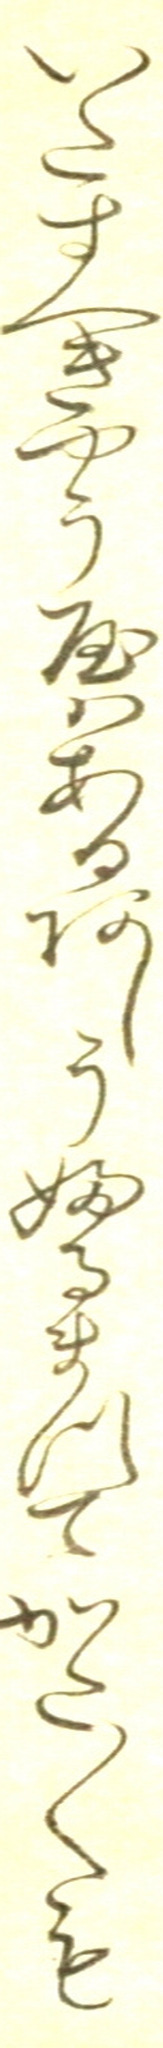いたすへきやうやはあるあしうふるまつてかた〳〵も
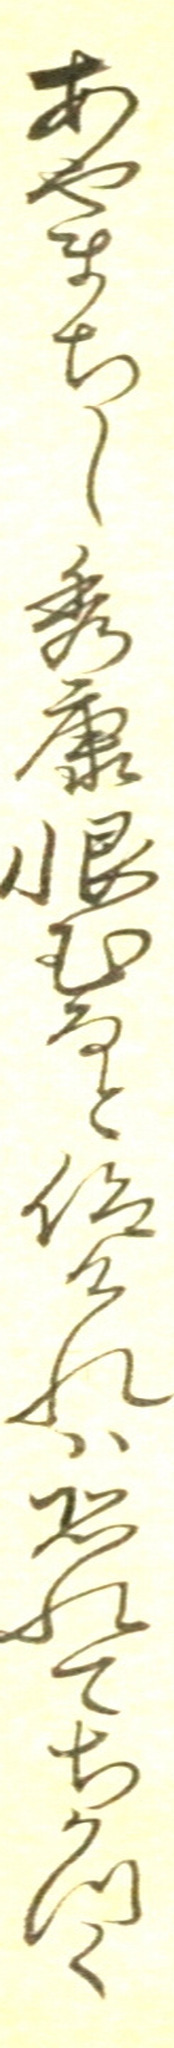あやまちし秀康恨むなと給けれは恐れてちかつく
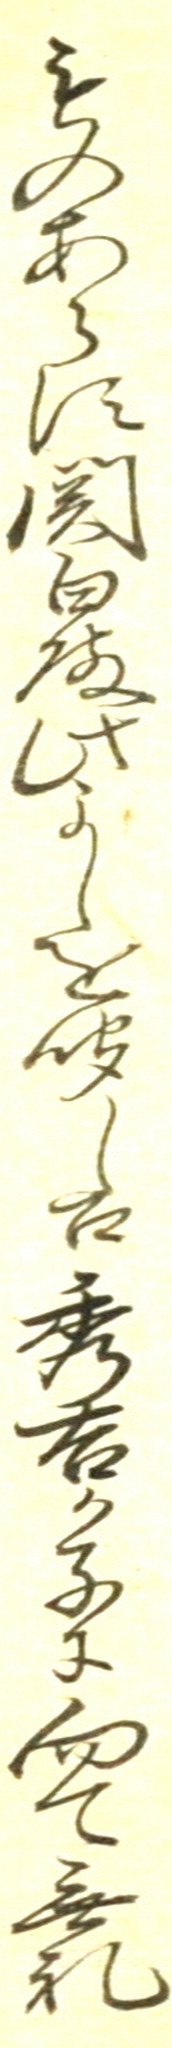ものあらす関白殿此よしを聞し召秀吉か子に向て無礼
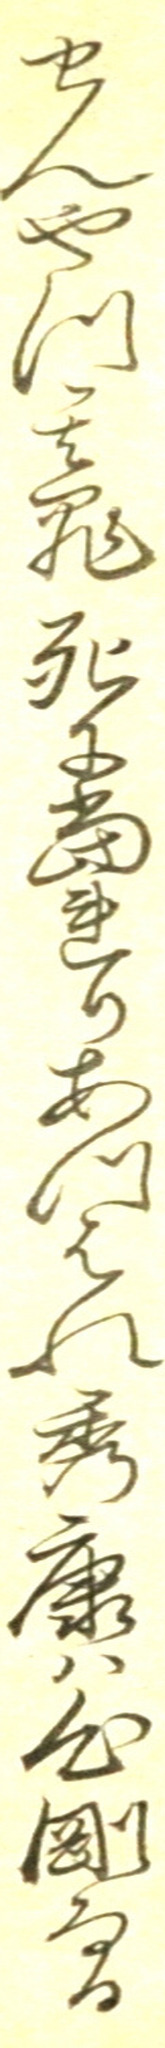せんやつ其罪死に当れりあつはれ秀康は心剛なる
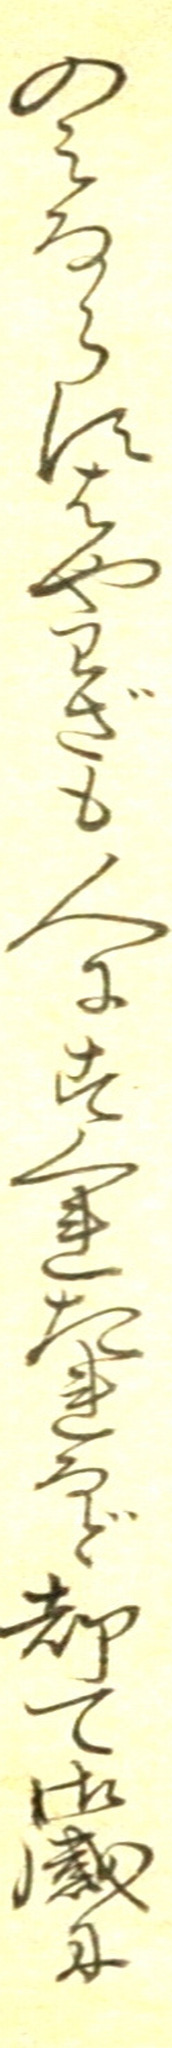のみならすはやわざも人にすくれたれなど却て御感に
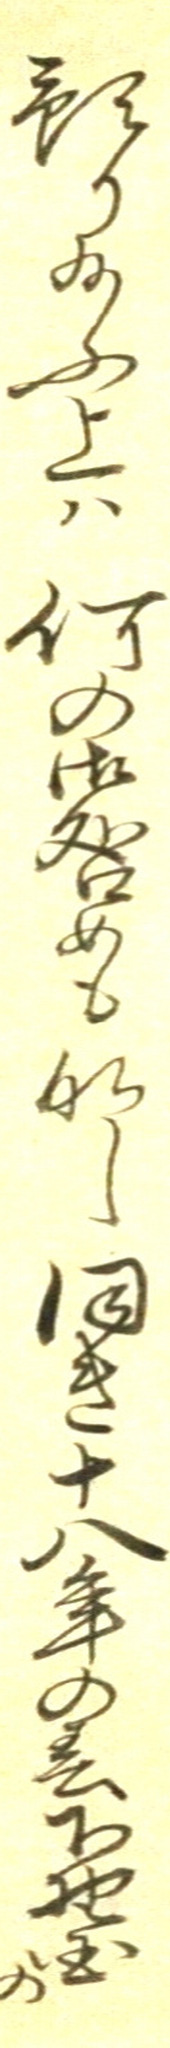預り給ふ上は何の御咎めもなし同き十八年の春下野国の
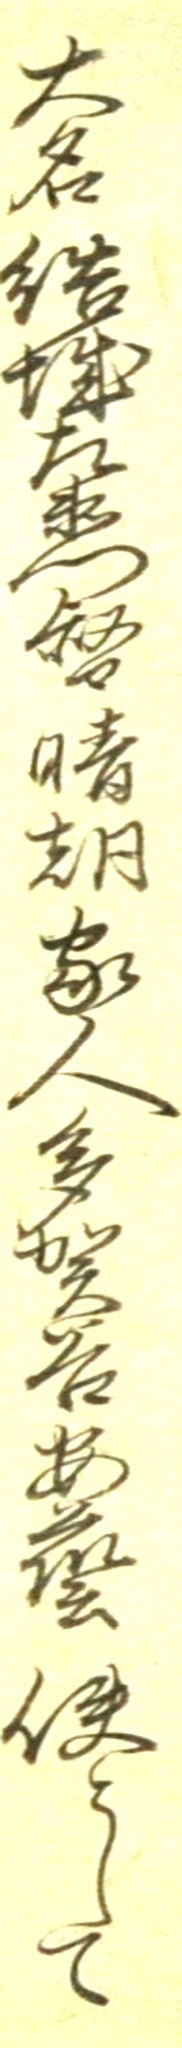大名結城左衛門督晴朝家人多賀谷安芸使として
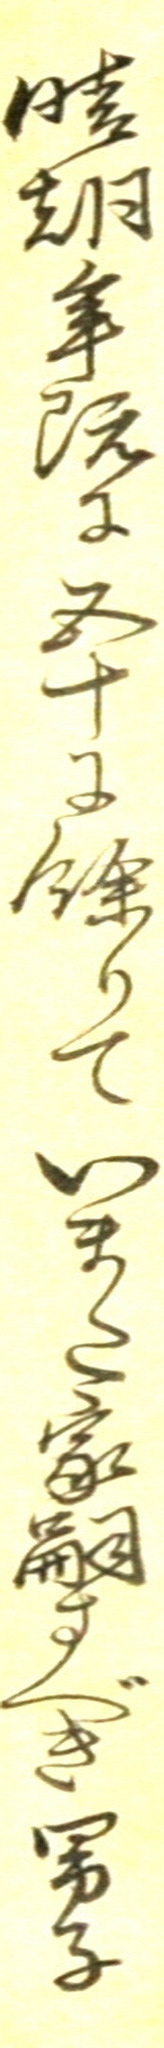晴朝年既に五十に余りていまた家嗣すべき男子

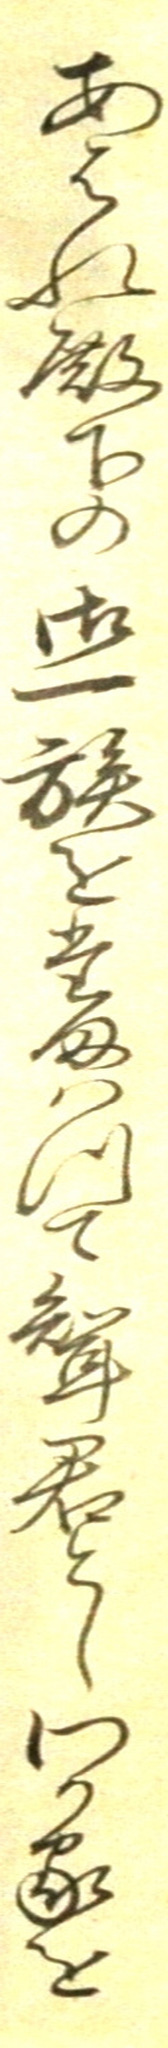あはれ殿下の御一族をたまはつて聟君としわか家を
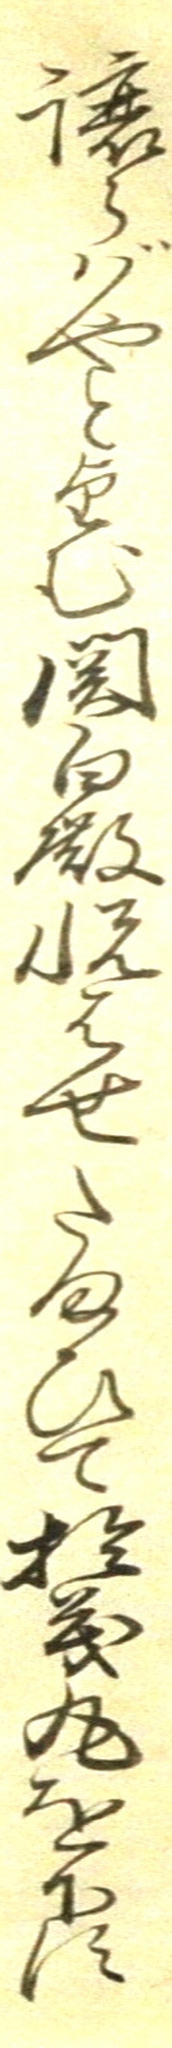譲らばやと望む関白悦はせたまひて於義丸を下す
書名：藩翰譜（一）
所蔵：伊那市立高遠町図書館・合同会社AMANE
